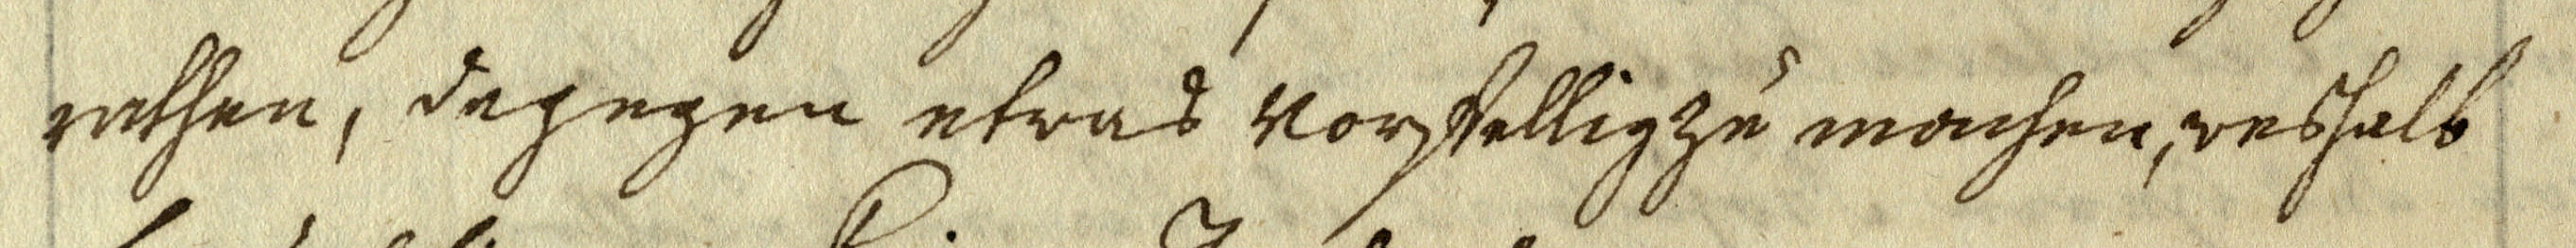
rathen, dagegen etwas vorstellig zu machen, weshalb
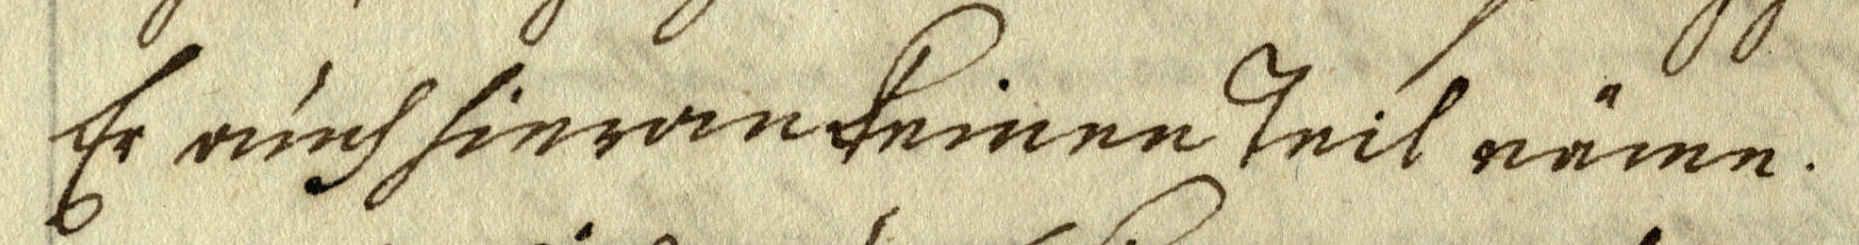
Er auch hieran keinen Teil näme.
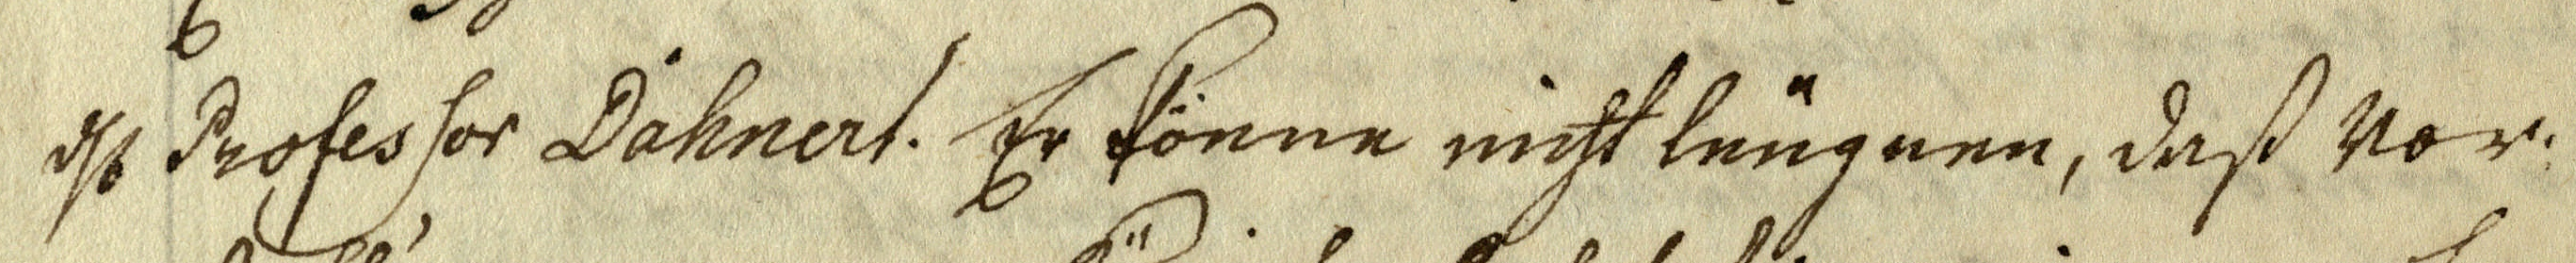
dh Professor Dähnert. Er könne nicht leugnen, daß Vor¬
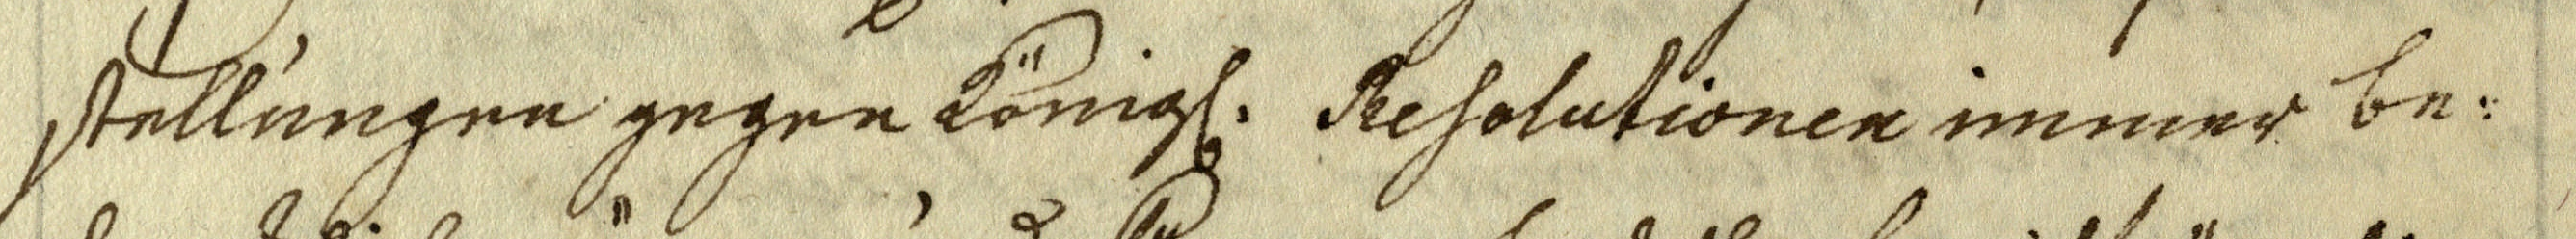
stellungen gegen Königl: Resolutionen immer be¬
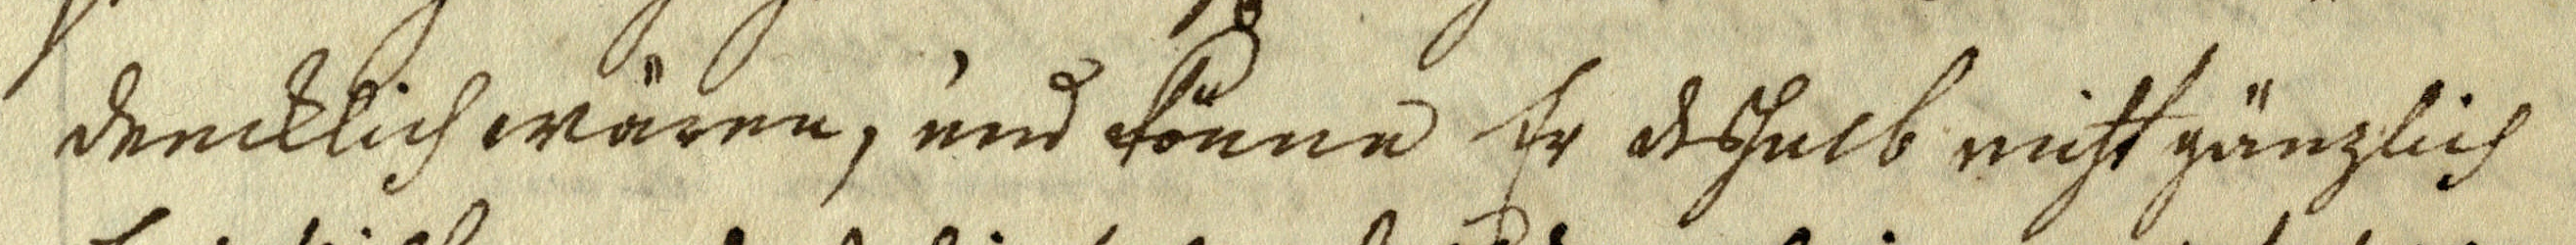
dencklich wären, und könne Er deshalb nicht gänzlich
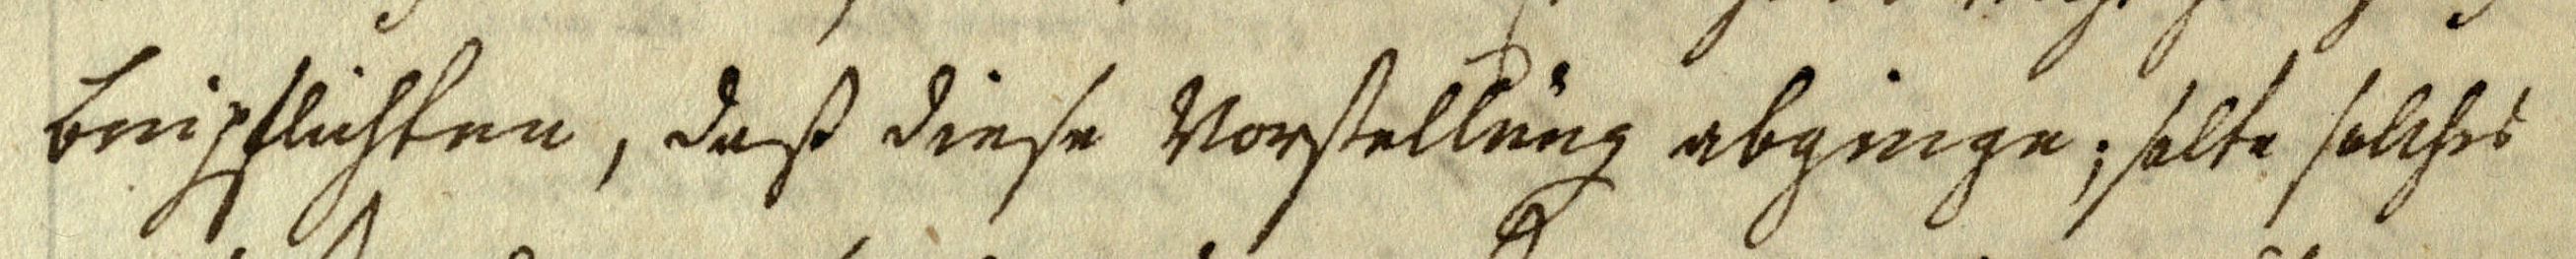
beipflichten, daß diese Vorstellung abginge, solte solches
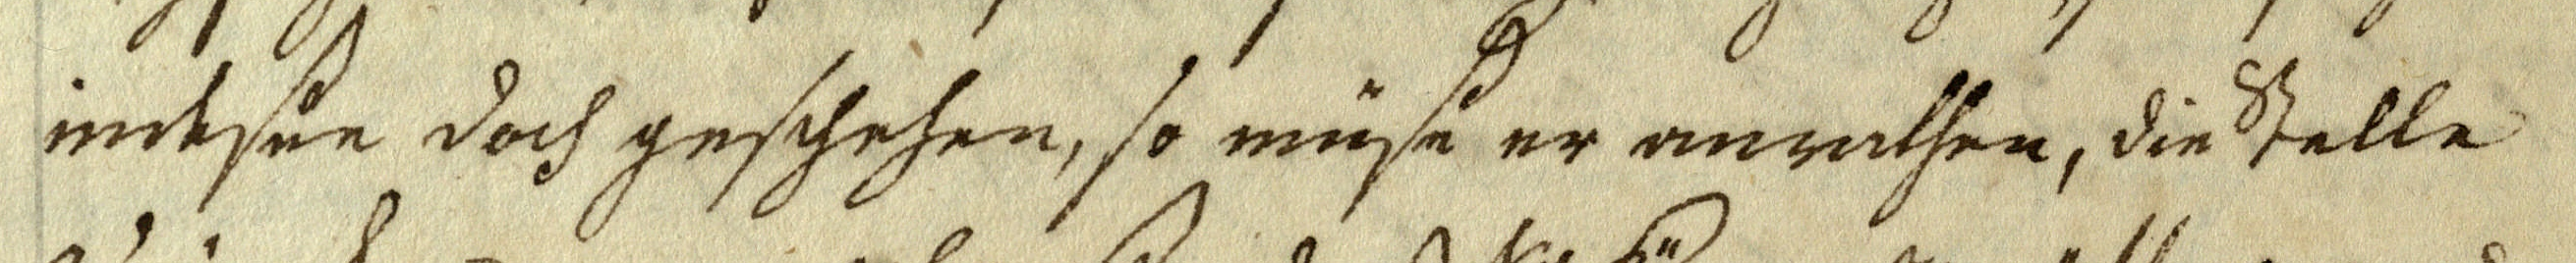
indeßen doch geschehen, so müße er anrathen, die Stelle
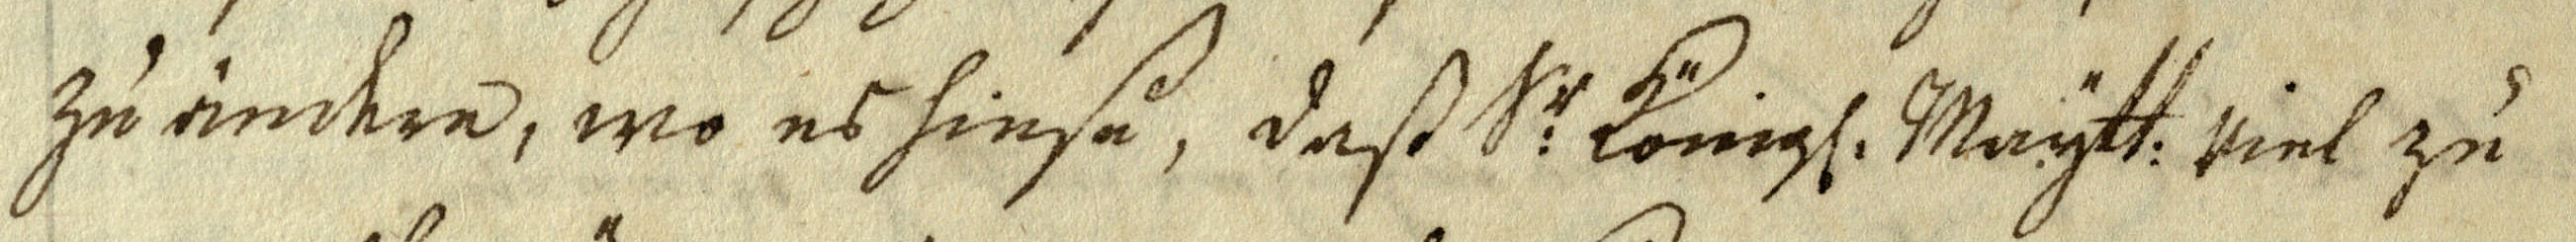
zu ändern, wo es hieße, daß Sr: Königl: Maÿst: viel zu
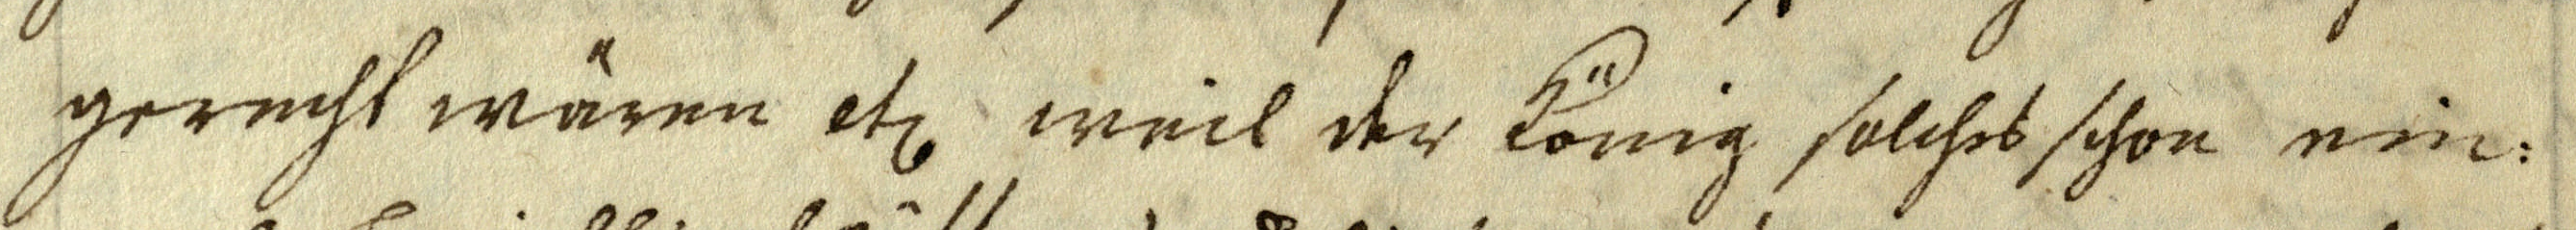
gerecht wären et. weil der König solches schon ein¬
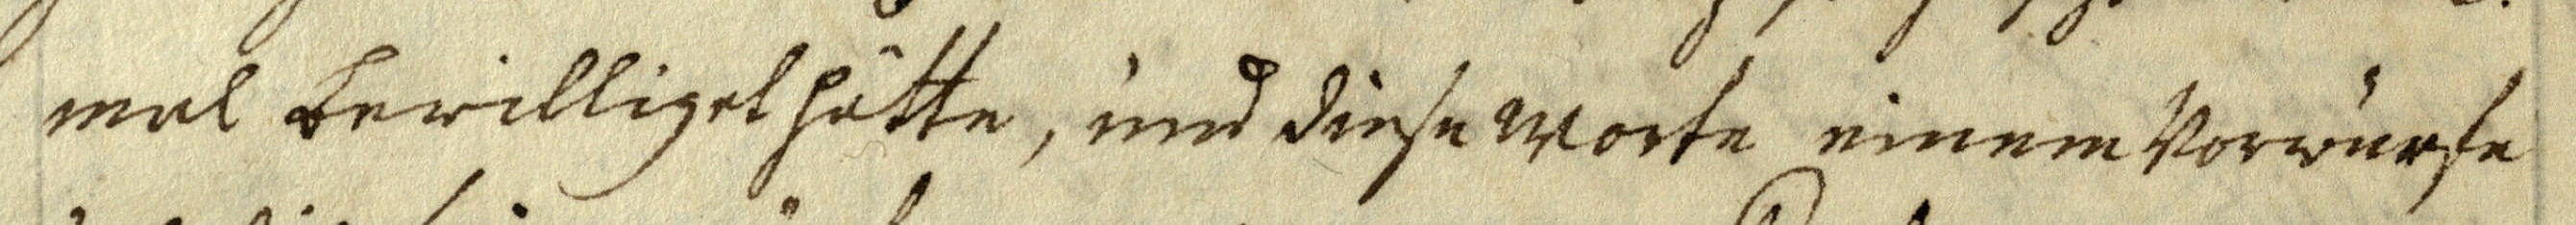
mal bewilliget hätte, und diese Worte einem Vorwurfe
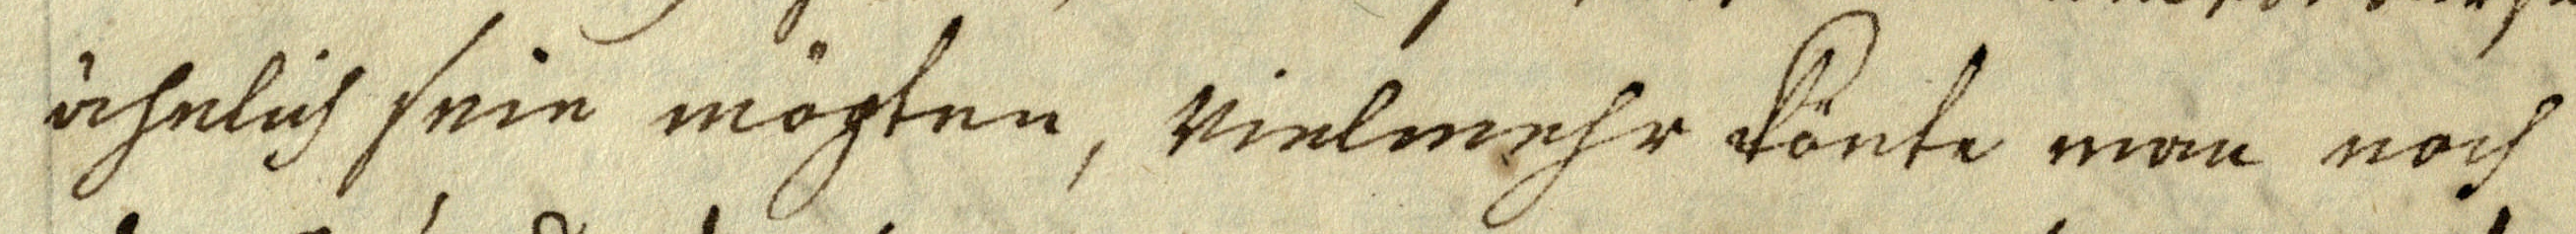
ähnlich sein mögten, vielmehr könte man noch
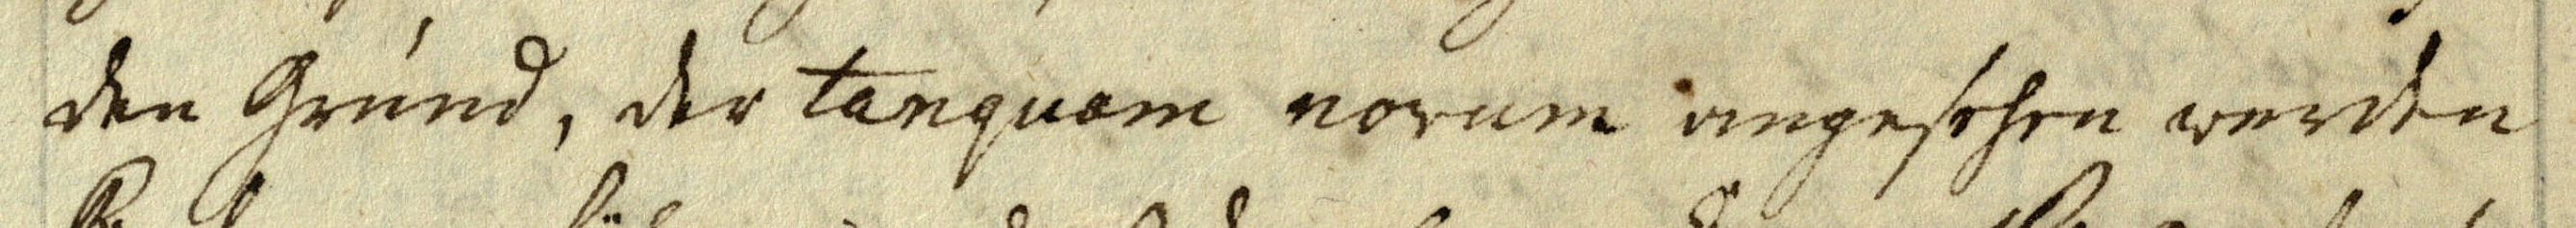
den Grund, der tanquam novum angesehen werden
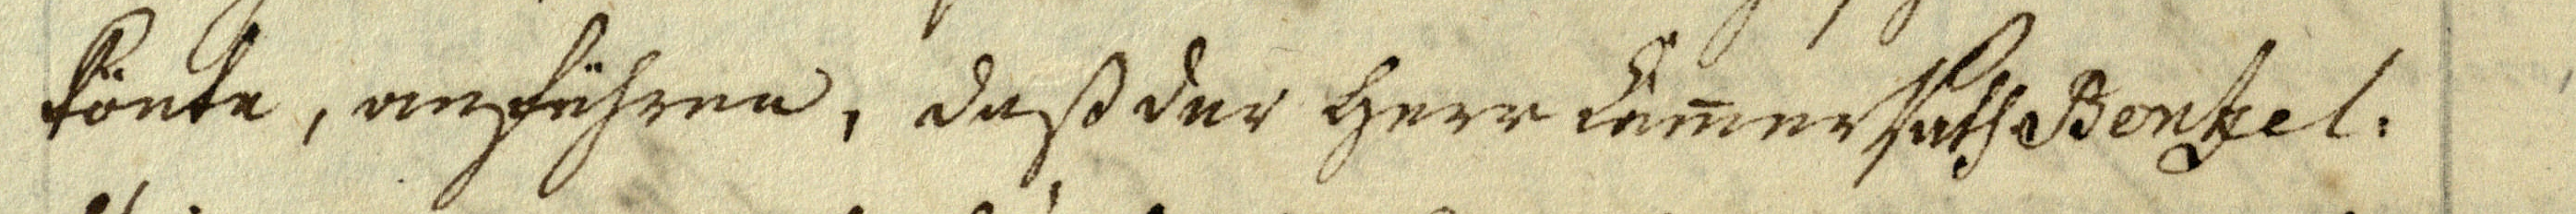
könte, anführen, daß der Herr CamerRath Bentzel¬
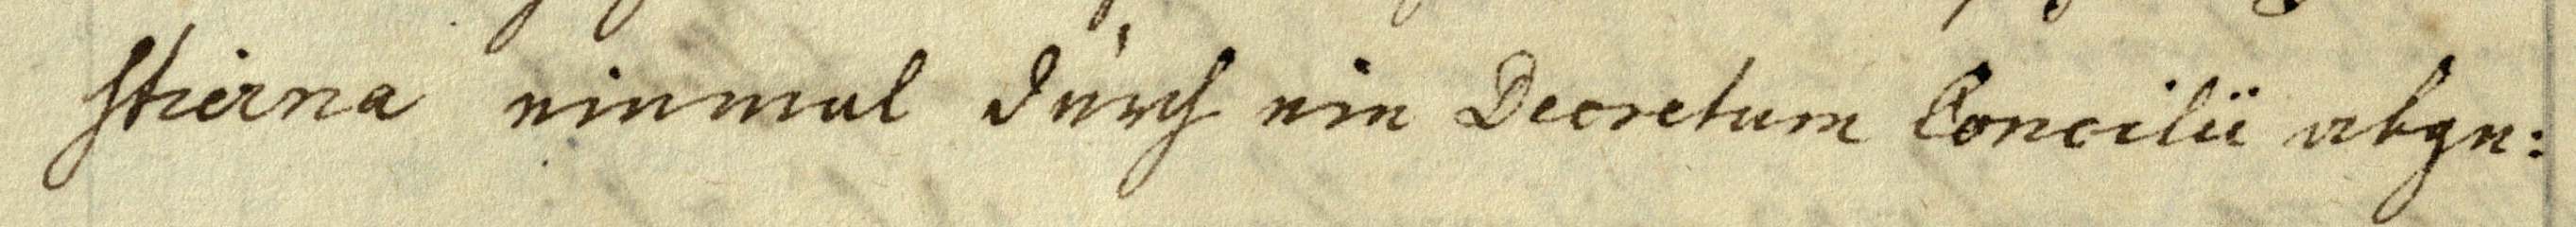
stierna einmal durch ein Decretum Concilii abge¬
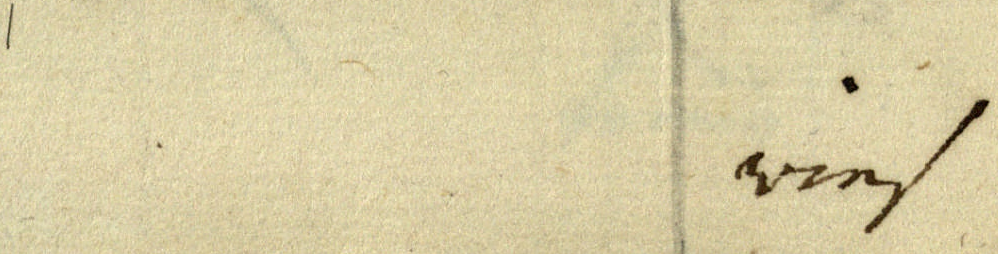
wies
